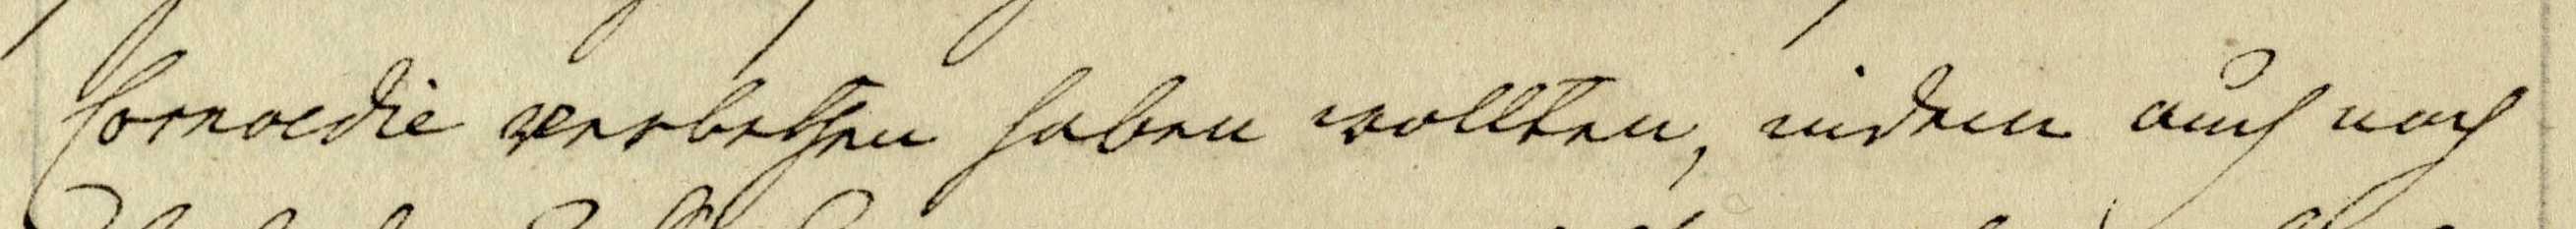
Cmoedie verbethen haben wollten, indem auch noch
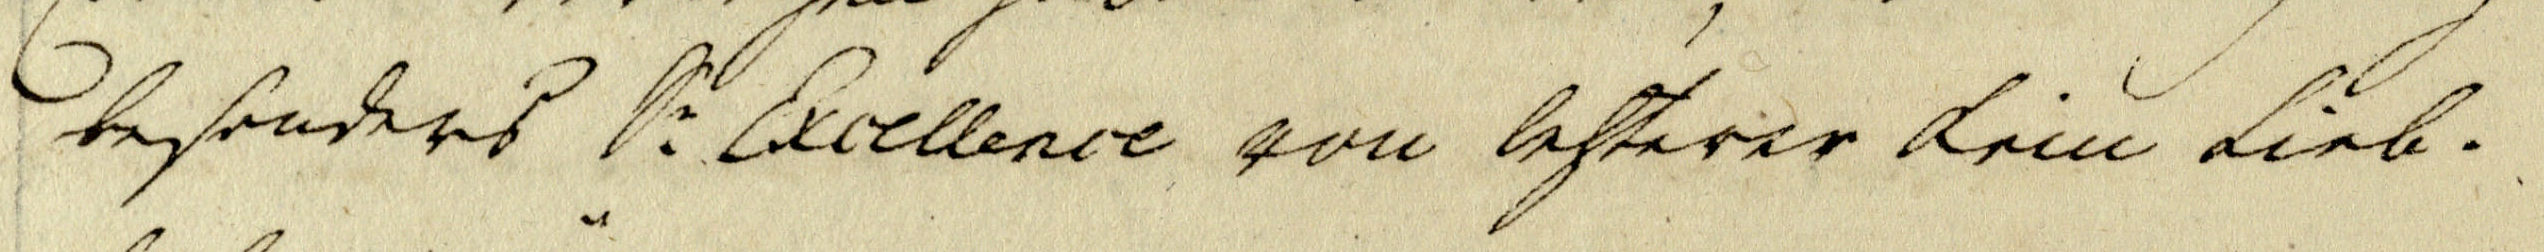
besonders Sr Excellence von letzterer kein Lieb¬
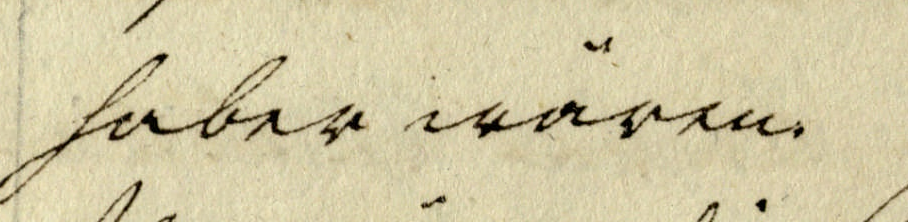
haber wären.
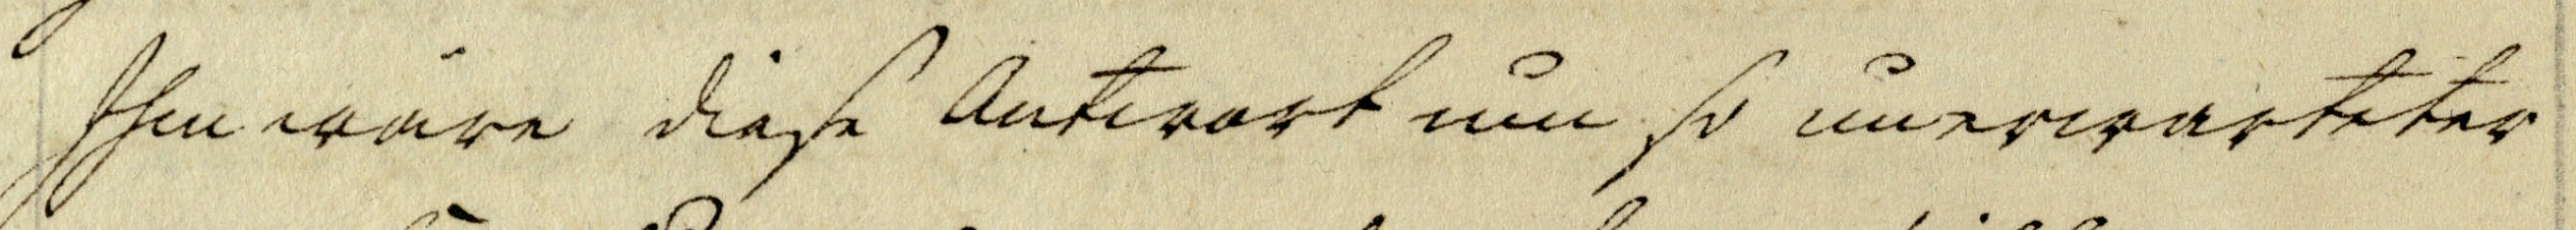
Ihm wäre diese Antwort um so unerwarteter
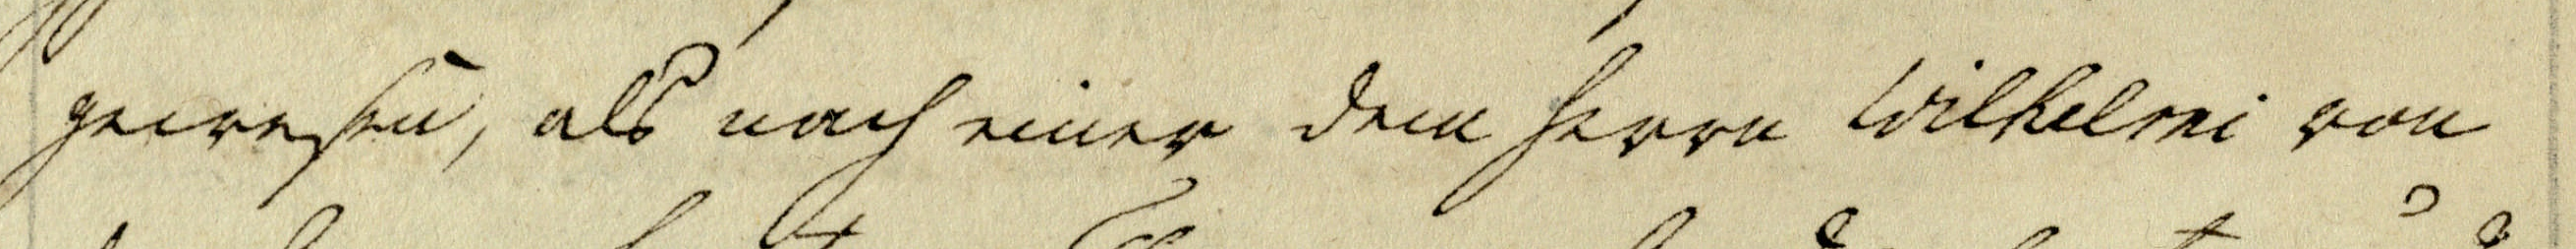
gewesen, als nach einer dem Herrn Wilhelmi von
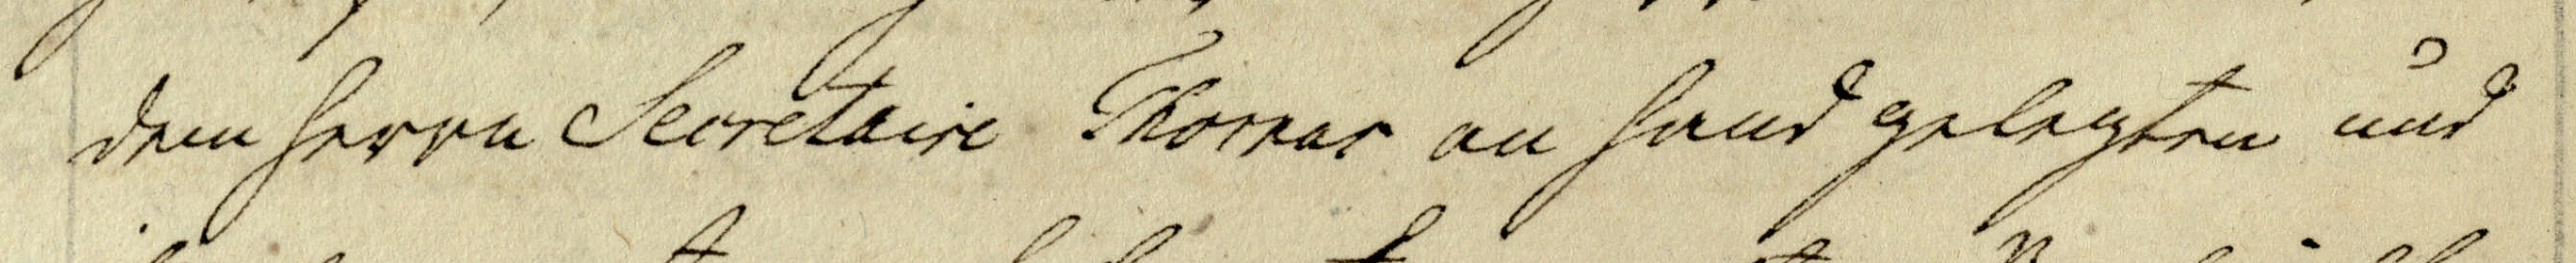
dem Herrn Secretaire Thomas an hand gelegten und
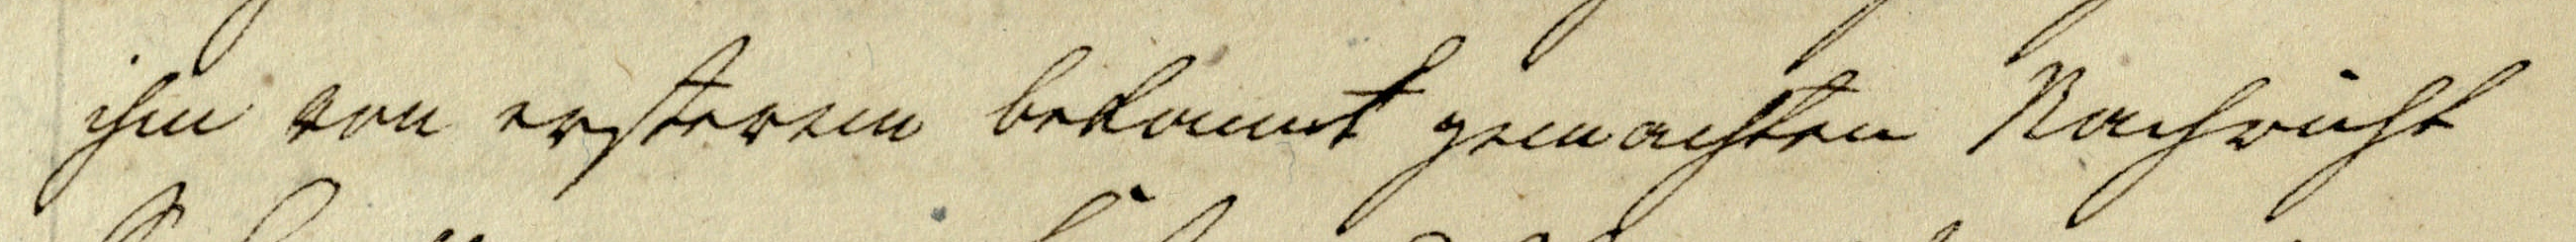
ihm von ersterem bekannt gemachten Nachricht
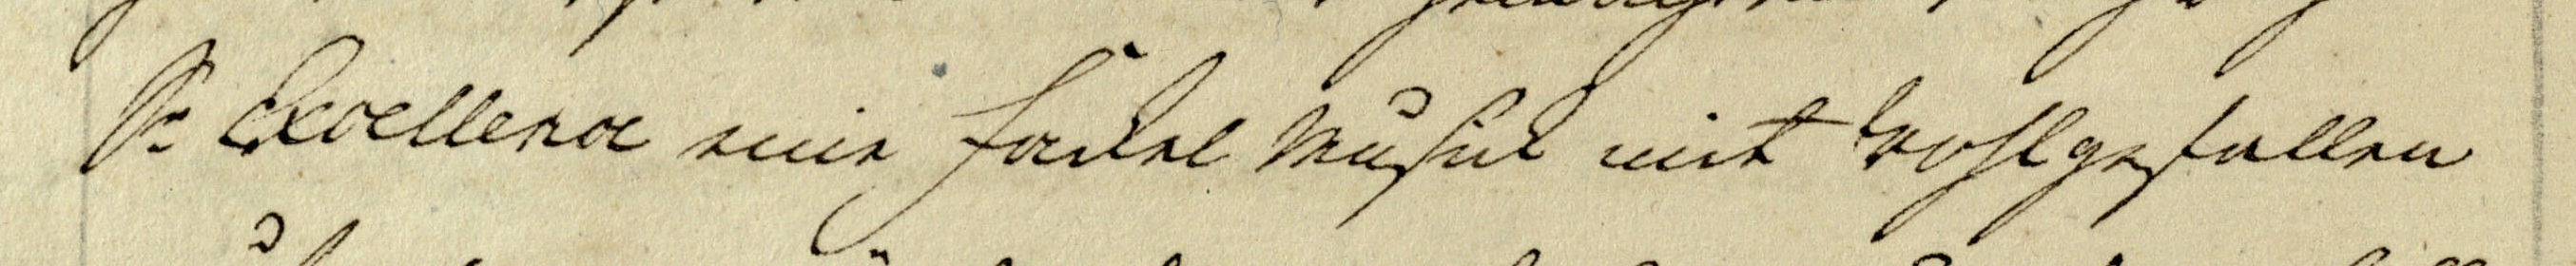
Sr Excellence eine Fackel Musick mit Wohlgefallen
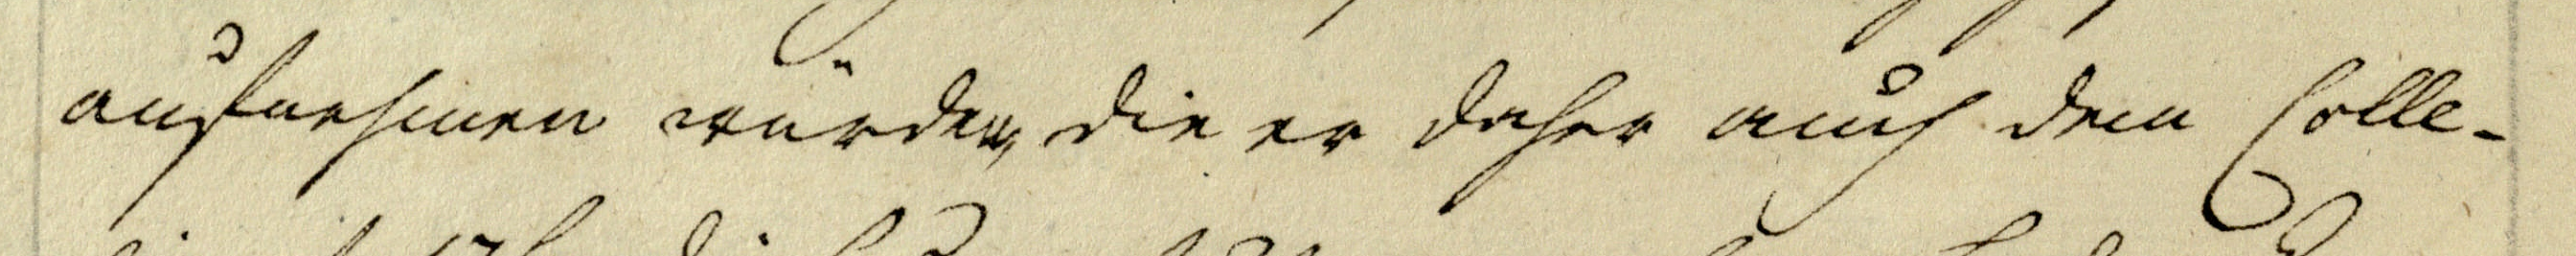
annehmen würden, die er daher auch dem Colle¬
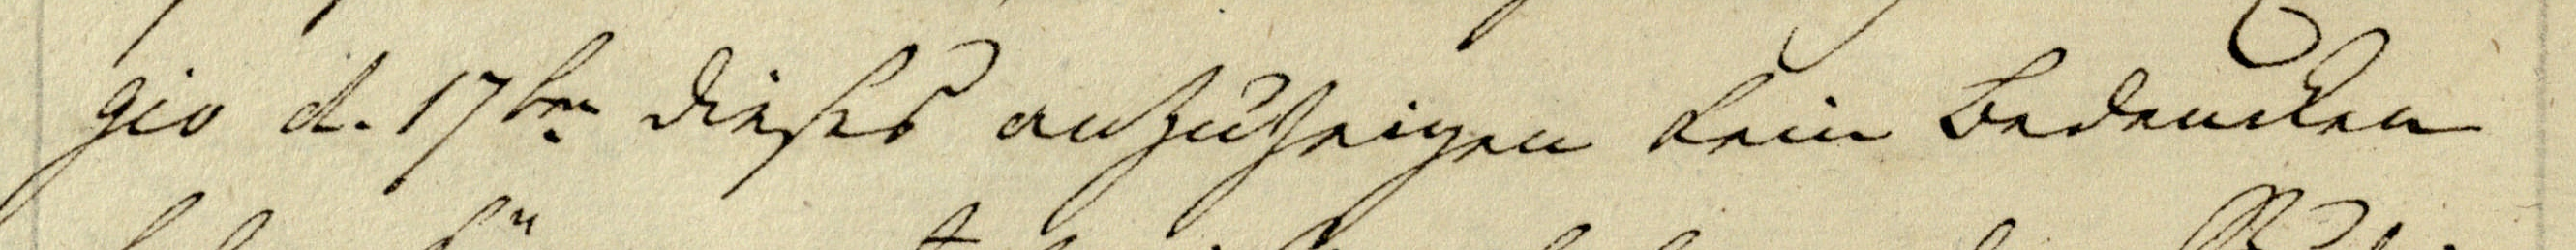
gio d. 17 ten dieses anzuzeigen kein Bedencken
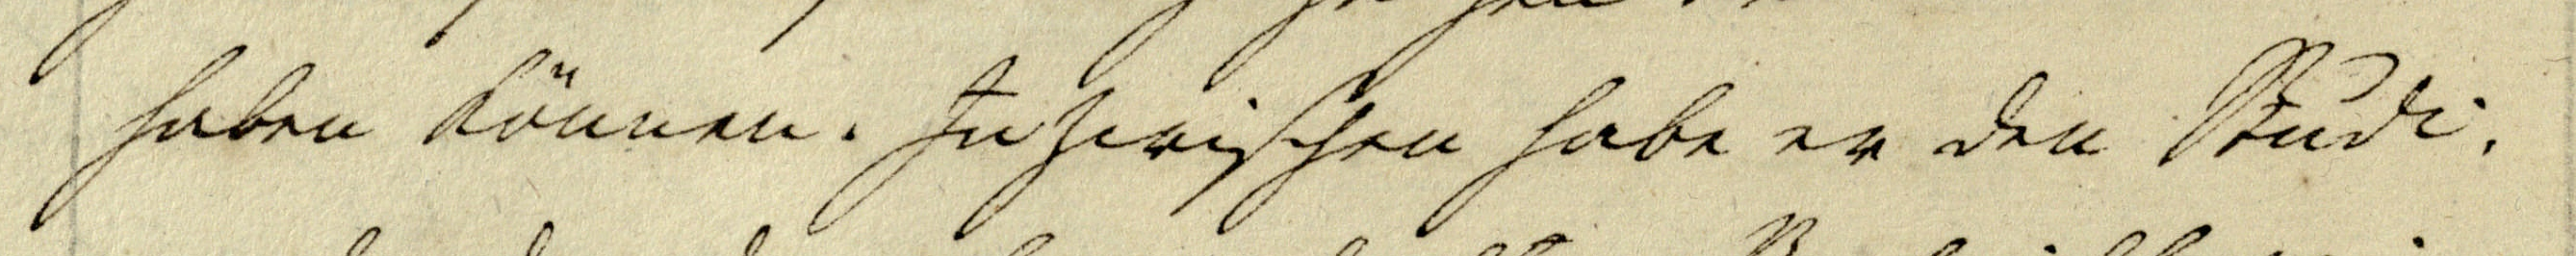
haben können. Inzwischen habe er den Studi¬
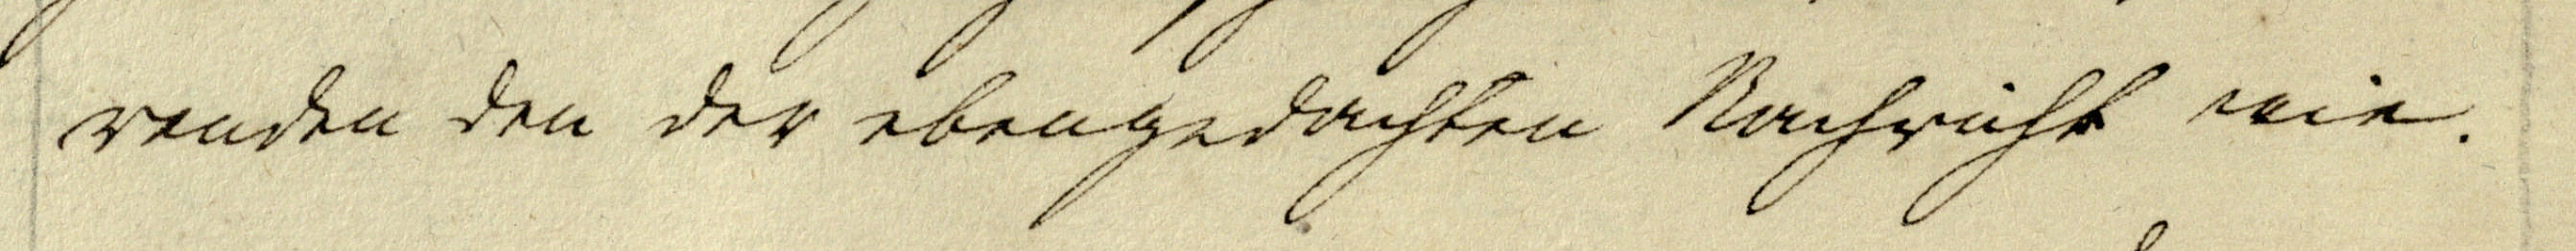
renden den der ebengedachten Nachricht wie¬
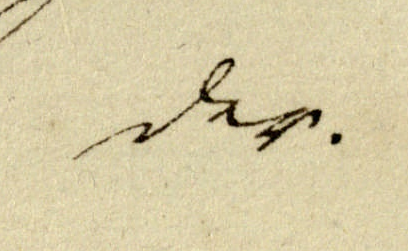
der.
